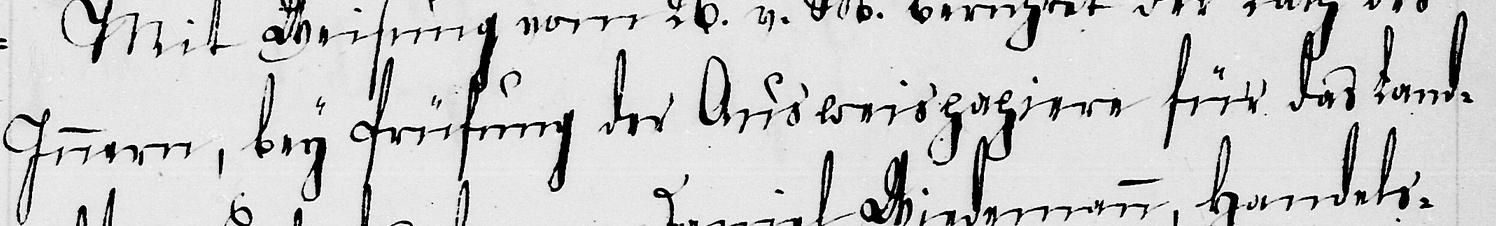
Innern, bey Prüfung der Ausweispapiere für das Land¬
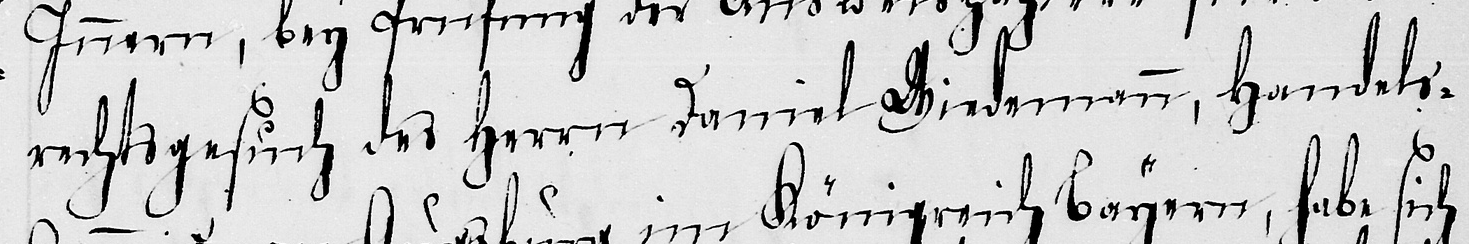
rechtsgesuch des Herrn Daniel Wiedemann, Handel¬
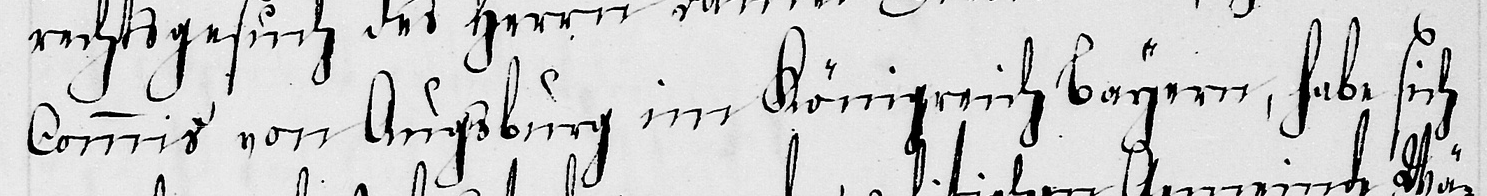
ommis von Augsburg im Königreich Bayern, habe sich
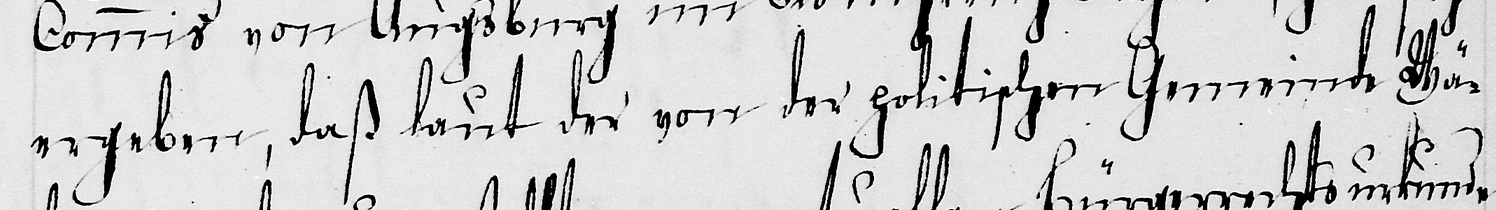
ergeben, daß laut der von der politischen Gemeinde Wä¬
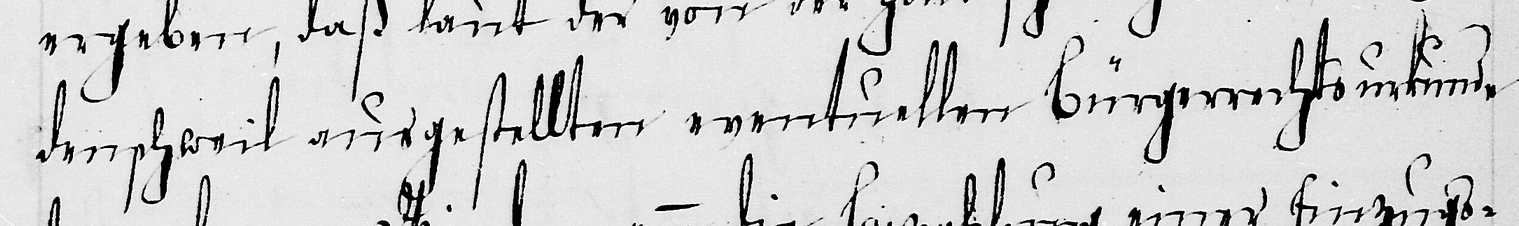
denschweil ausgestellten eventuellen Bürgerrechtsurkunde
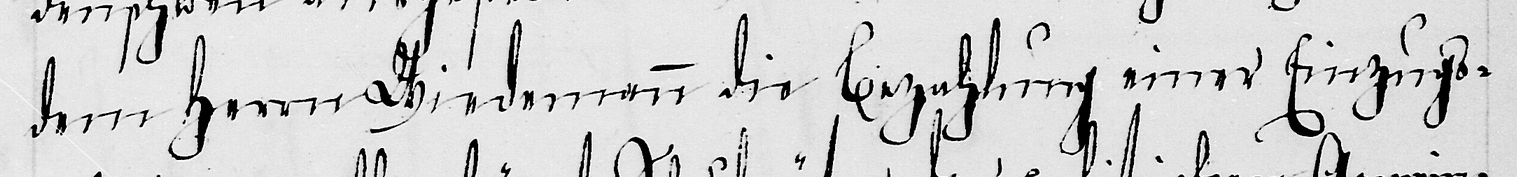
dem Herrn Wiedemann die Bezahlung einer Einzugs¬
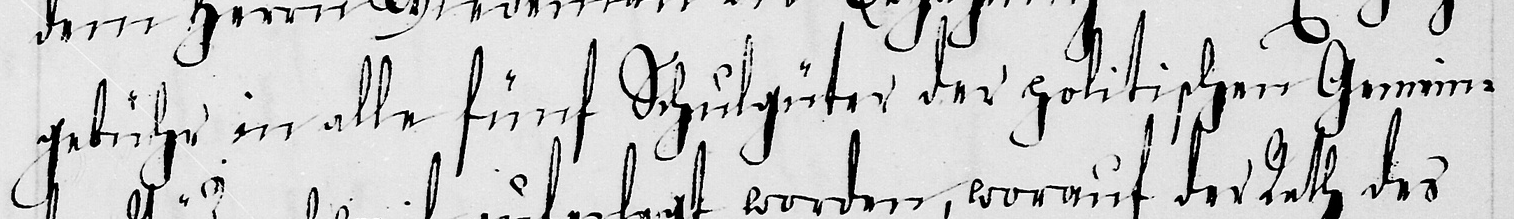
gebühr in alle fünf Schulgüter der politischen Gemein¬
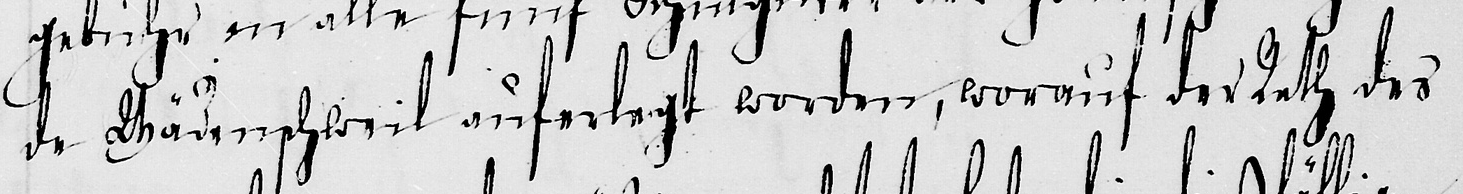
de Wädenschweil auferlegt worden, worauf der Rath des
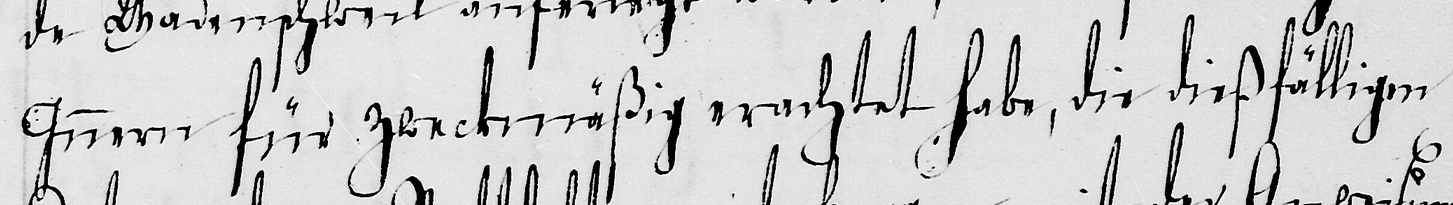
Innern für zweckmäßig erachtet habe, die dießfälligen
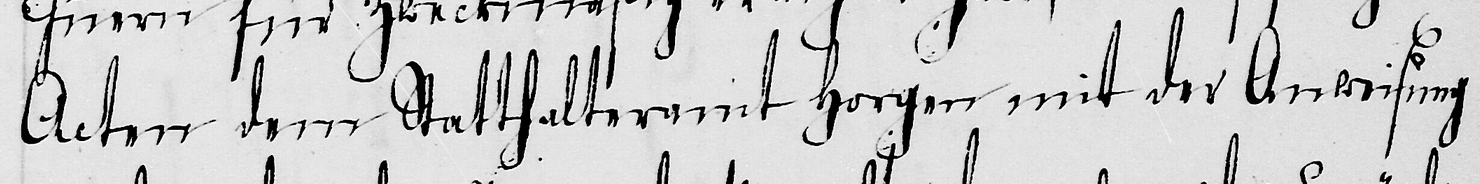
Acten dem Statthalteramt Horgen mit der Anweisung
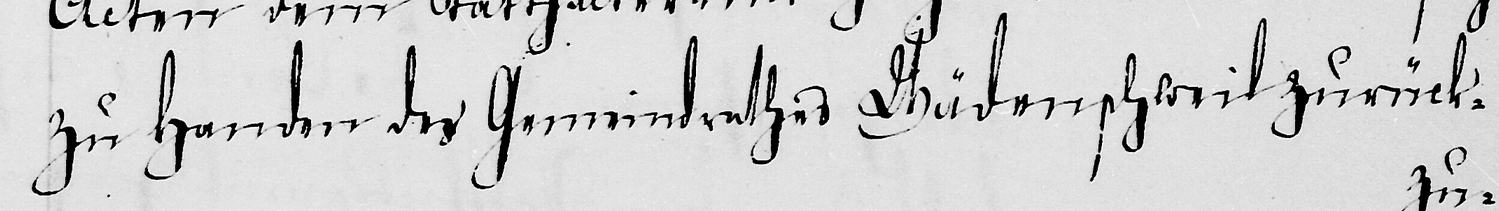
zu Handen des Gemeindrathes Wädenschweil zurück-
